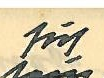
sich
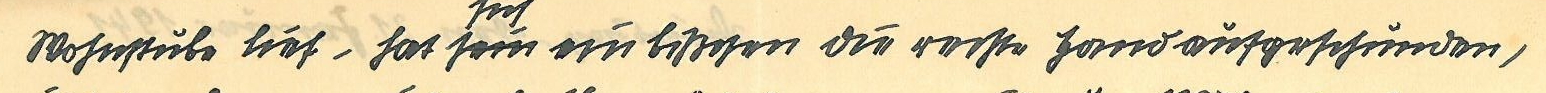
Wohnstube lief – hat sein ein bißchen die rechte Hand aufgeschunden,
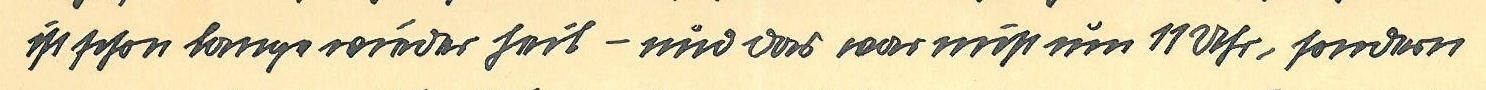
ist schon lange wieder heil – und das war nicht um 11 Uhr, sondern
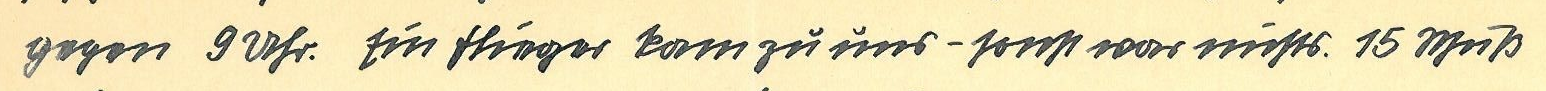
gegen 9 Uhr. Ein Flieger kam zu uns – sonst war nichts. 15 Schuß
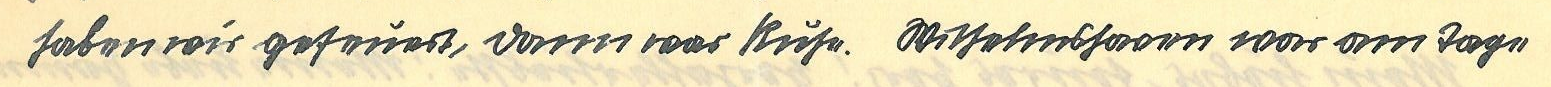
haben wir gefeuert, dann war Ruhe. Wilhelmshaven war am Tage
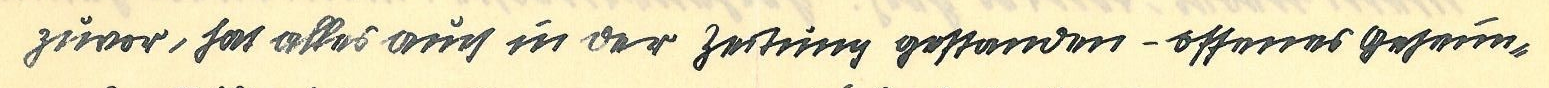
zuvor, hat alles auch in der Zeitung gestanden – offenes Geheim¬
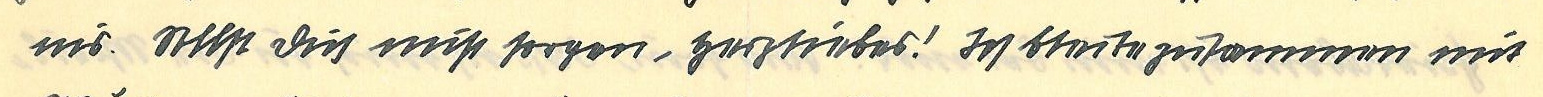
nis. Sollst Dich nicht sorgen, Herzliebes! Ich bleibe zusammen mit
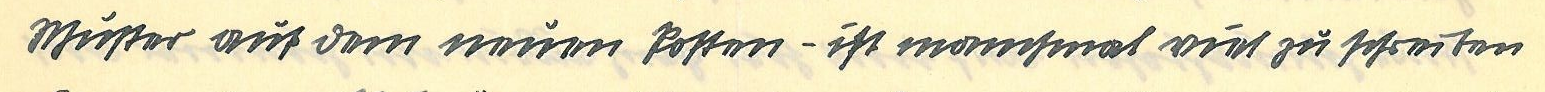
S. auf dem neuen Posten – ist manchmal viel zu schreiben
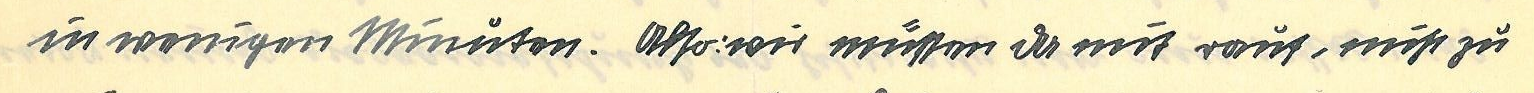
in wenigen Minuten. Also: wir müssen da mit rauf, nicht zu
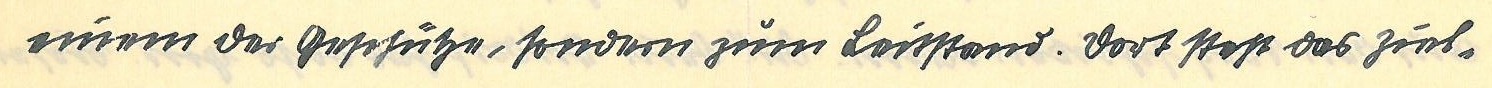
einem der Geschütze, sondern zum Leitstand. Dort steht das Ziel¬
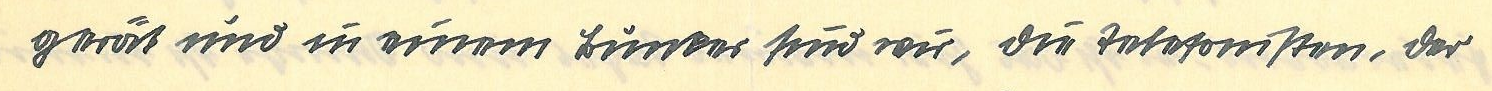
gerät und in einem Bunker sind wir, die Telefonisten, der
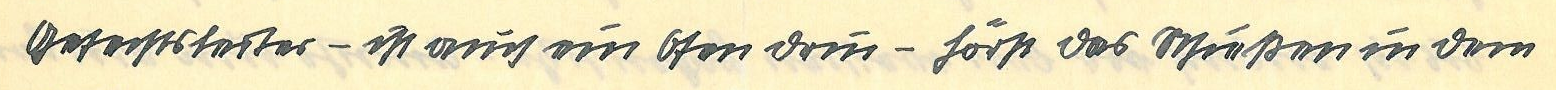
Gefechtsleiter – ist auch ein Ofen drin – hörst das Schießen in dem
